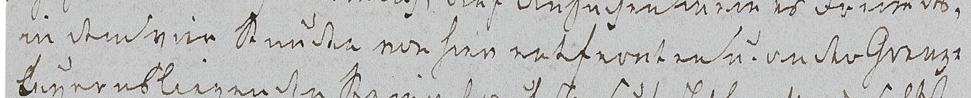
in dem vier Stunden von hier entfernten u. an der Grenze
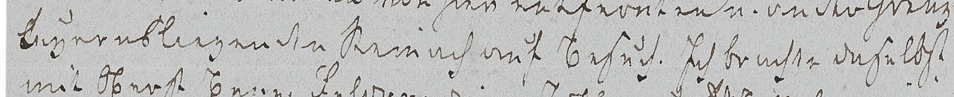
Luzerns liegenden Reinach auf Besuch. Ich brachte daselbst
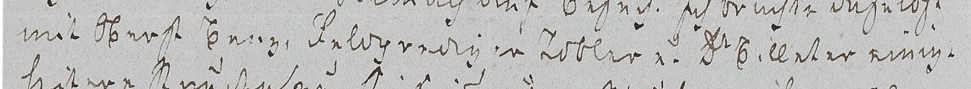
mit Oberst Benz, Feldprediger Tobler u. DrBilleter einige
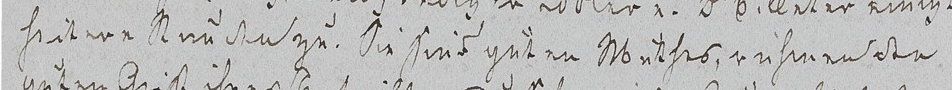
heitere Stunden zu. Sie sind guten Muthes, rühmen den
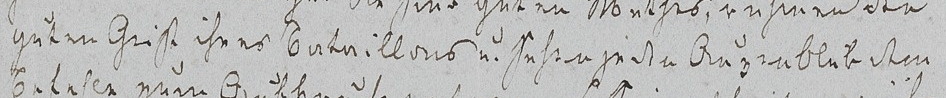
guten Geist ihres Bataillons u. sehen jeden Augenblick dem
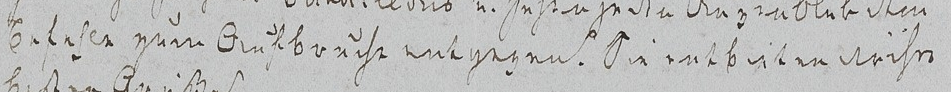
Befehle zum Aufbruche entgegen. Sie entbieten dir ihre
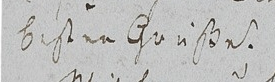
besten Grüße.
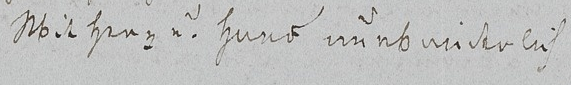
Mit Herz u. Hand unabänderlich
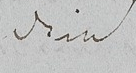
Dein
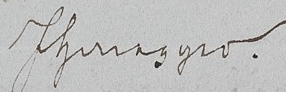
Honegger.
